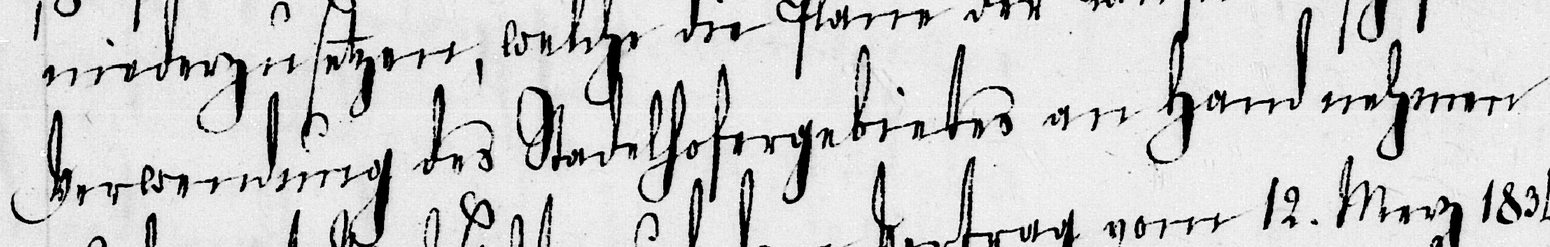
Verwendung des Stadelhofergebietes an Hand nehmen
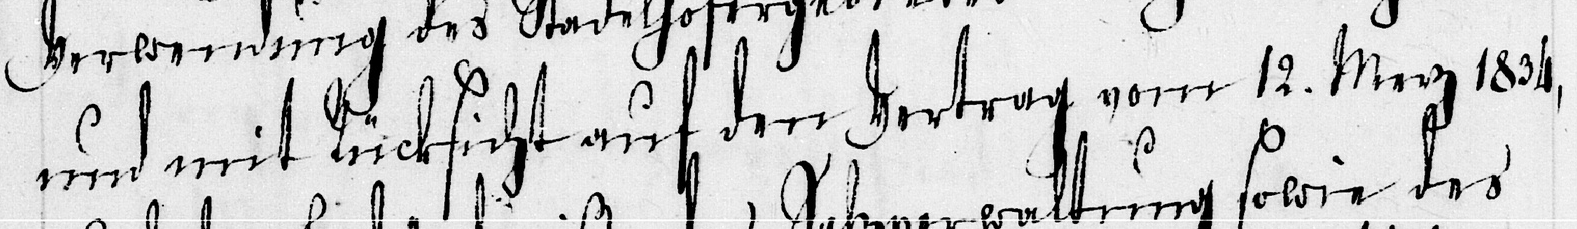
und mit Rücksicht auf den Vertrag vom 12. Merz 1834,
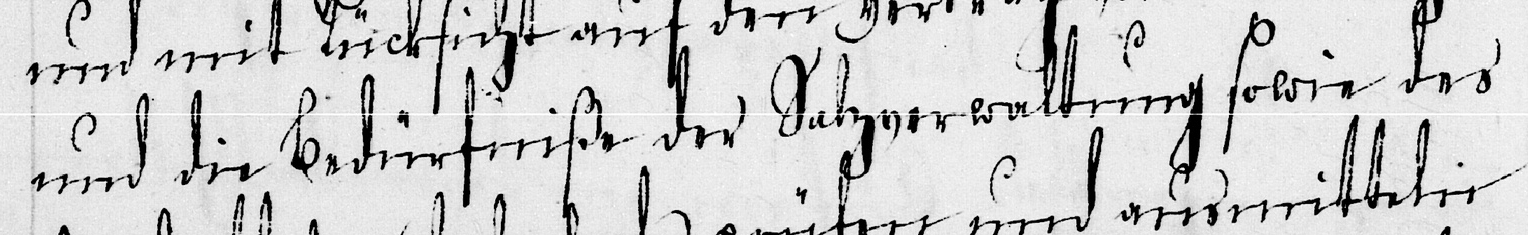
und die Bedürfniße der Salzverwaltung sowie des
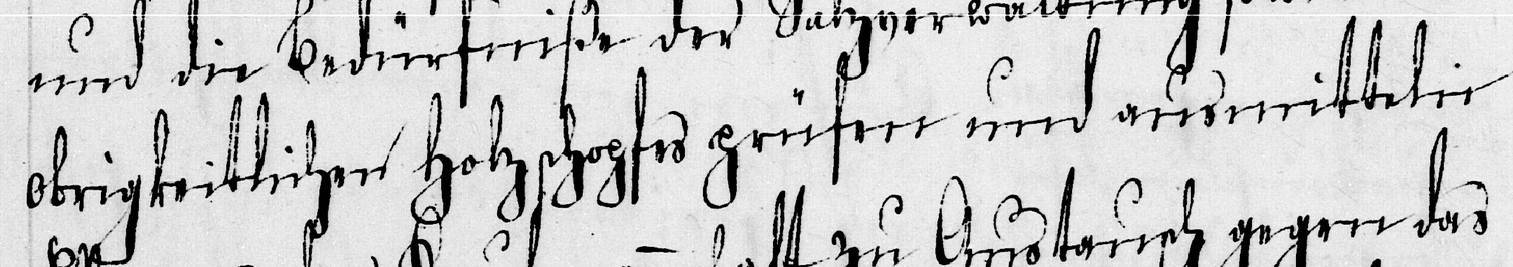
obrigkeitlichen Holzschopfes prüfen und ausmitteln
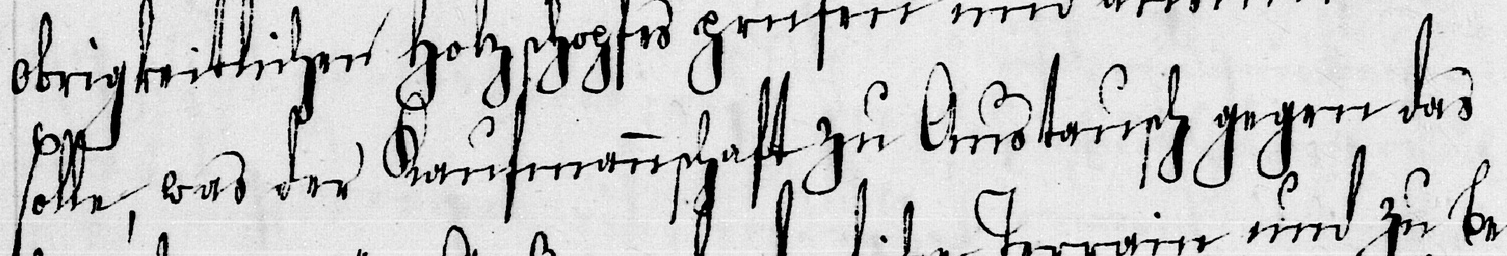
solle, was der Kaufmannschaft zu Austausch gegen das
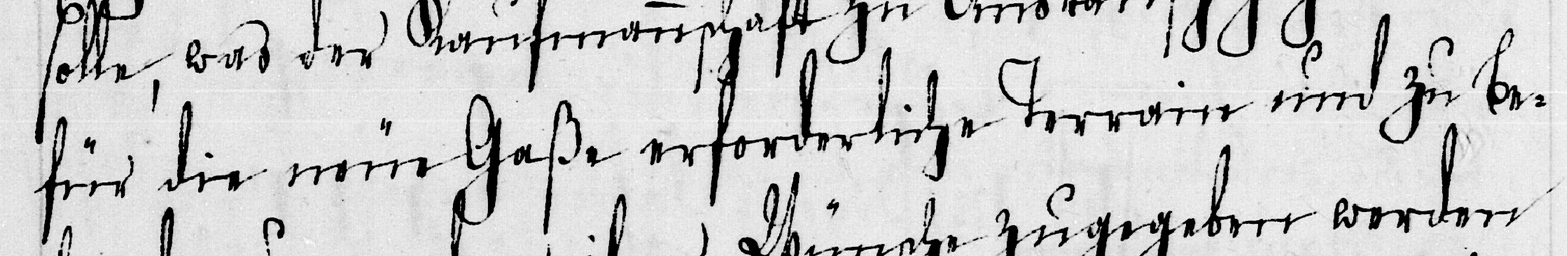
für die neue Gaße erforderliche Terrain und zu Be¬
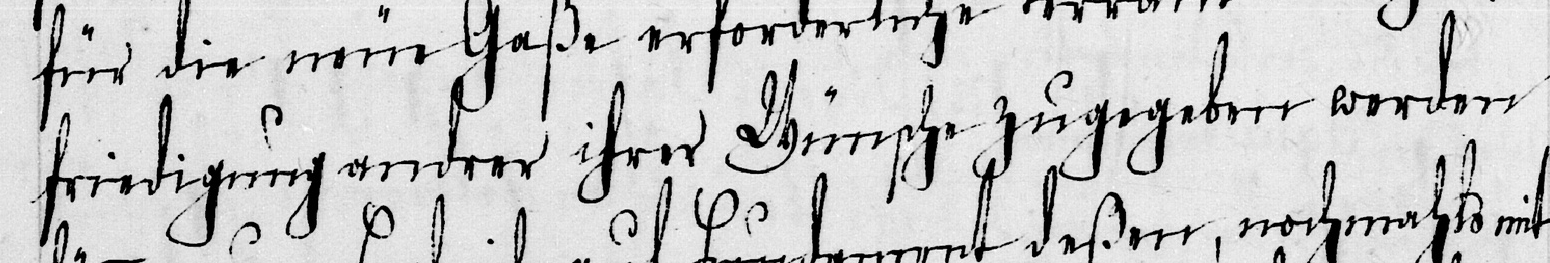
friedigung andrer ihrer Wünsche zugegeben werden
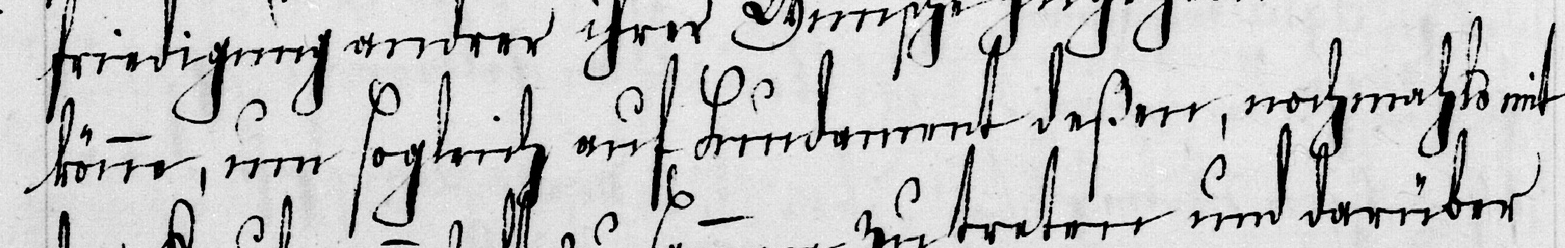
könne, um sogleich auf Fundament deßen, nochmahls m¬
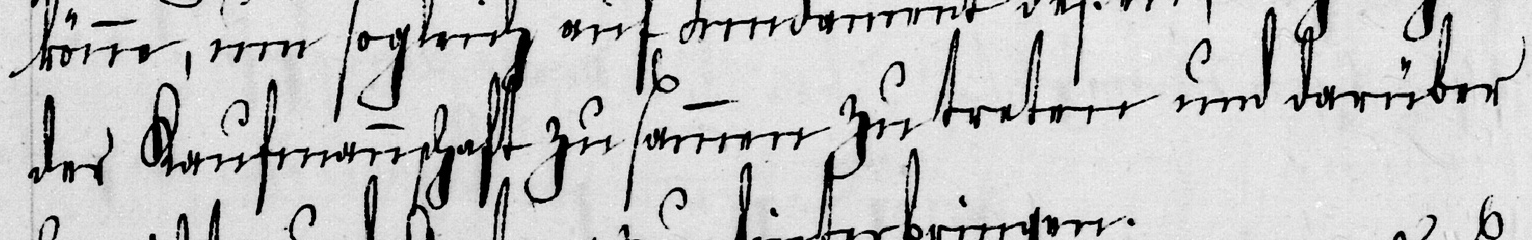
der Kaufmannschaft zusammen zu treten und darüber
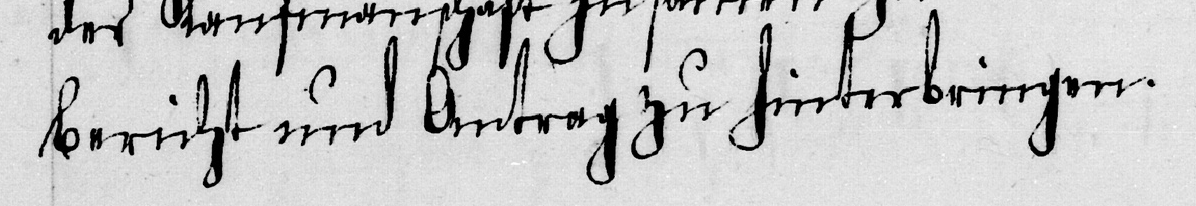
Bericht und Antrag zu hinterbringen.
